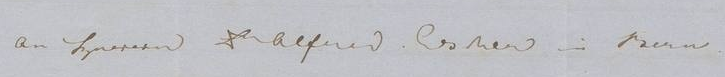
An Herrn Dr Alfred Escher in Bern
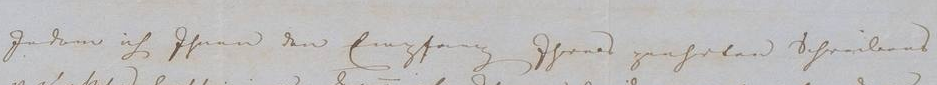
Indem ich Ihnen den Empfang Ihres geehrten Schreibens
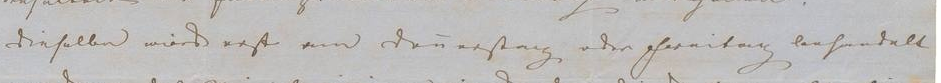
Dieselbe wird erst am Donnerstag oder Freitag behandelt
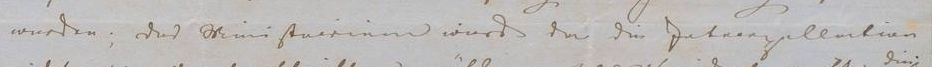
werden; das Ministerium wird da die Interpellation
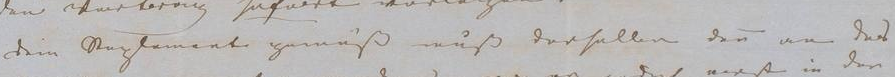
Dem Reglement gemäß muß derselbe dann an das
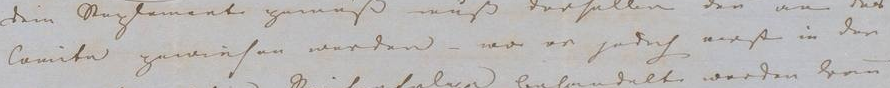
Comite gewiesen werden – wo er jedoch erst in der
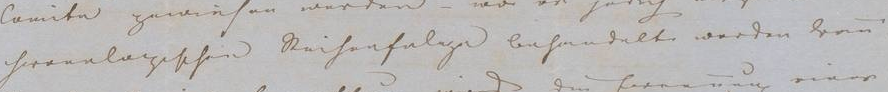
chronologischen Reihenfolge behandelt werden kann.
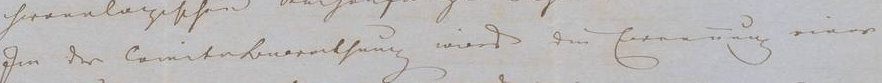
In der ComiteBerathung wird die Ernennung einer
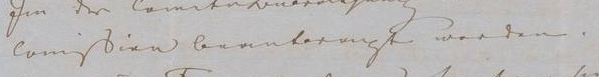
Comission beantragt werden.
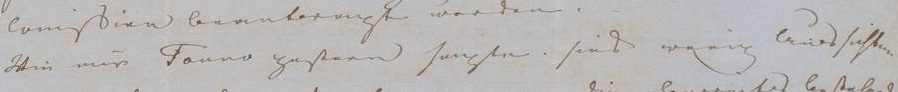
Wie mir Fannogestern sagte – sind wenig Aussichten
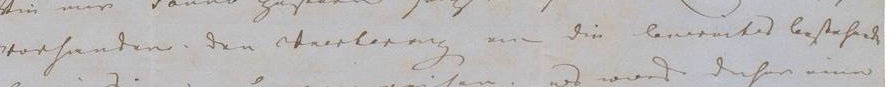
vorhanden – den Vertrag an die bereits bestehende
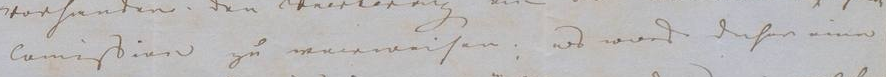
Comission zu verweisen; es wird daher eine
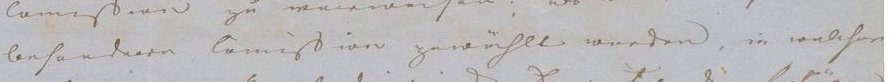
besondere Comission gewählt werden, in welcher
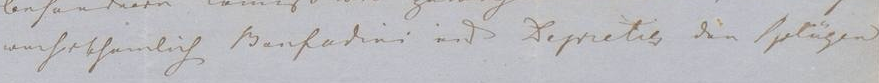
wahrscheinlich Bonfadini und Depretis den Splügen
